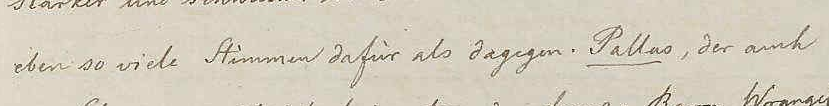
eben so viele Stimmen dafür als dagegen. Pallas, der auch
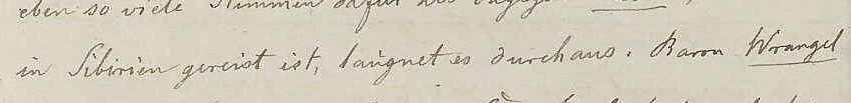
in Sibirien gereist ist, läugnet es durchaus. Baron Wrangel
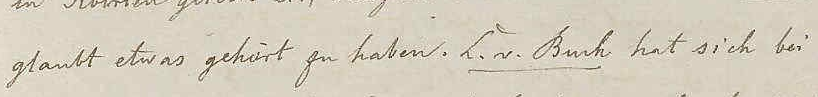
glaubt etwas gehört zu haben. L. v. Buch hat sich bei
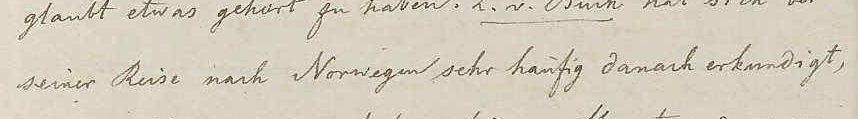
seiner Reise nach Norwegen sehr häufig danach erkundigt,
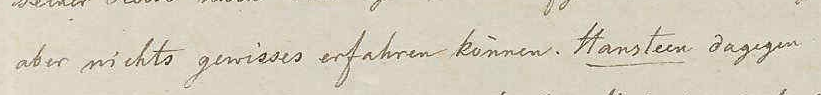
aber nichts gewisses erfahren können. Hansteen dagegen
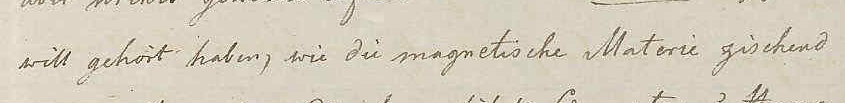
will gehört haben, wie die magnetische Materie zischend
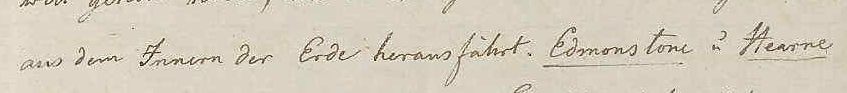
aus dem Innern der Erde herausfährt. Edmonstone u Hearne
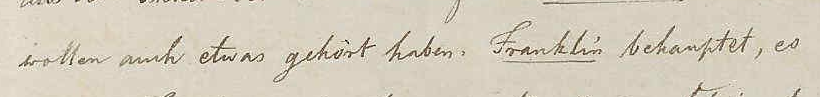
wollen auch etwas gehört haben. Franklin behauptet, es
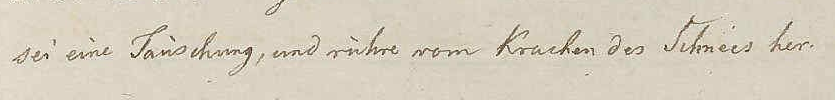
sei eine Täuschung, und rühre vom Krachen des Schnees her.
